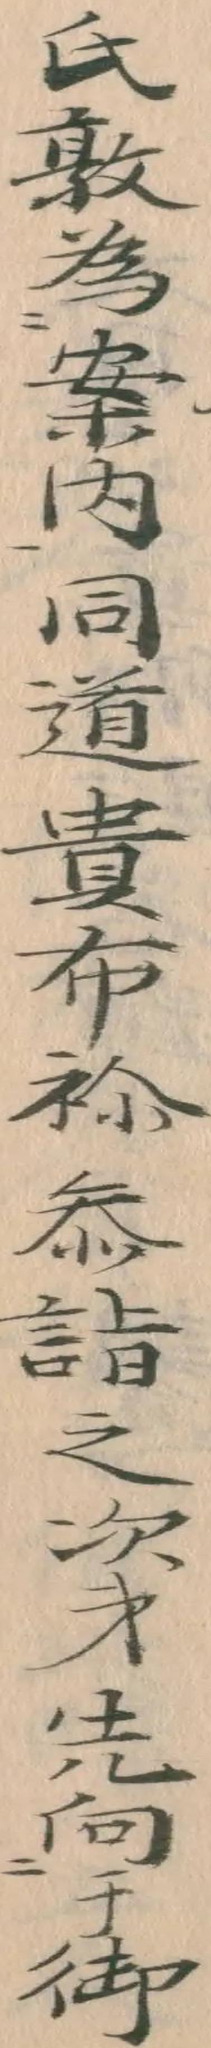氏敦為案内同道貴布称参詣之次第先向于御
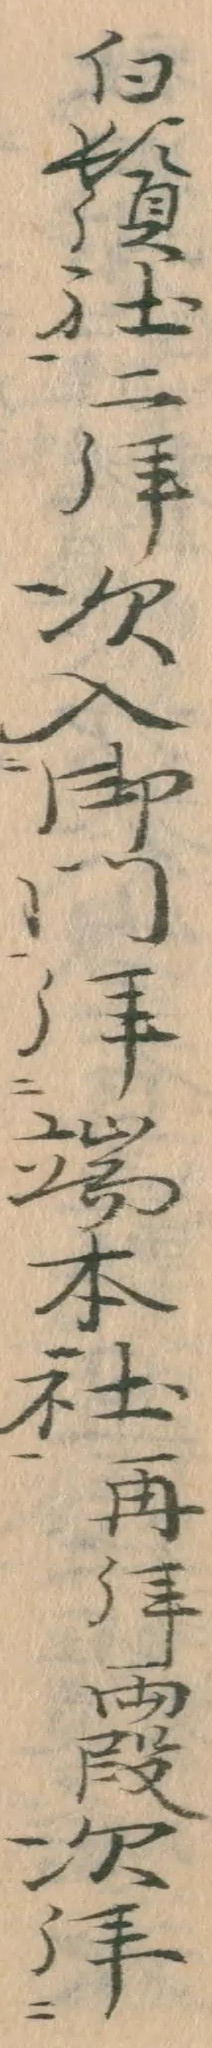白髪社二拝次入御門拝端本社再拝両段次拝
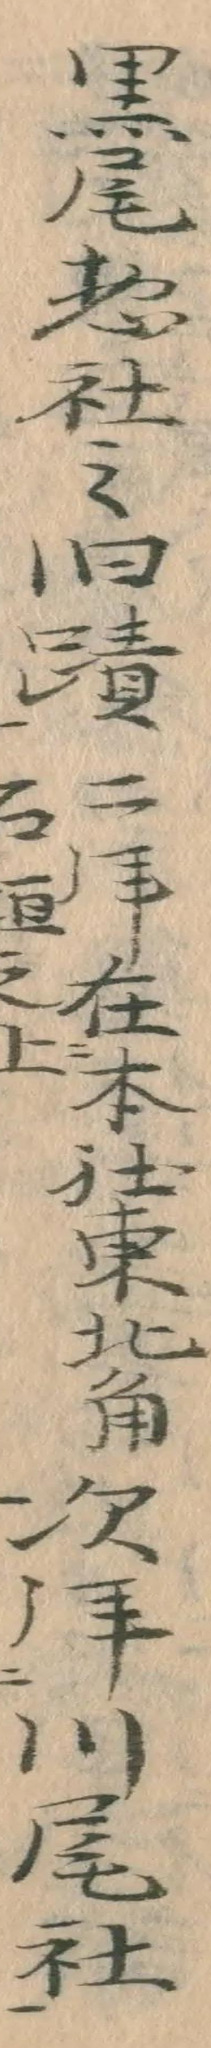黒尾惣社之旧蹟二拝在本社東北角石垣之上次拝川尾社
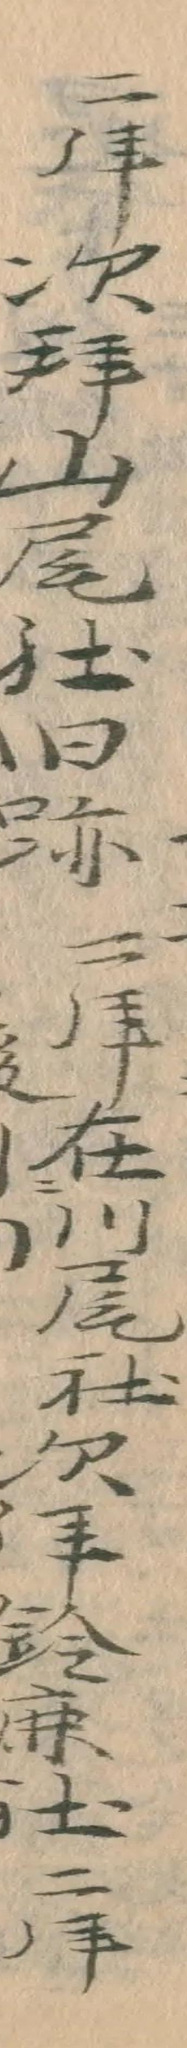二拝次拝山尾社旧跡二拝在川尾社之跡川向次拝鈴鹿社二拝

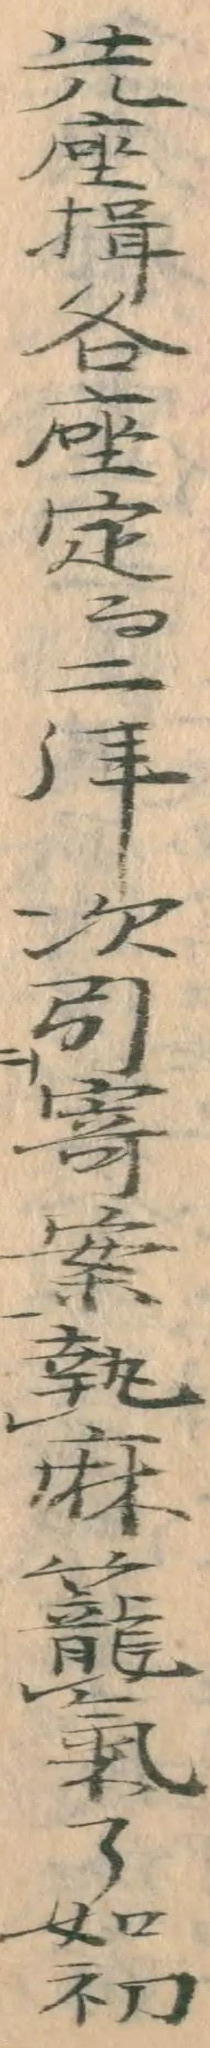先座揖各座定而二拝次引寄案執麻籠氣了如初
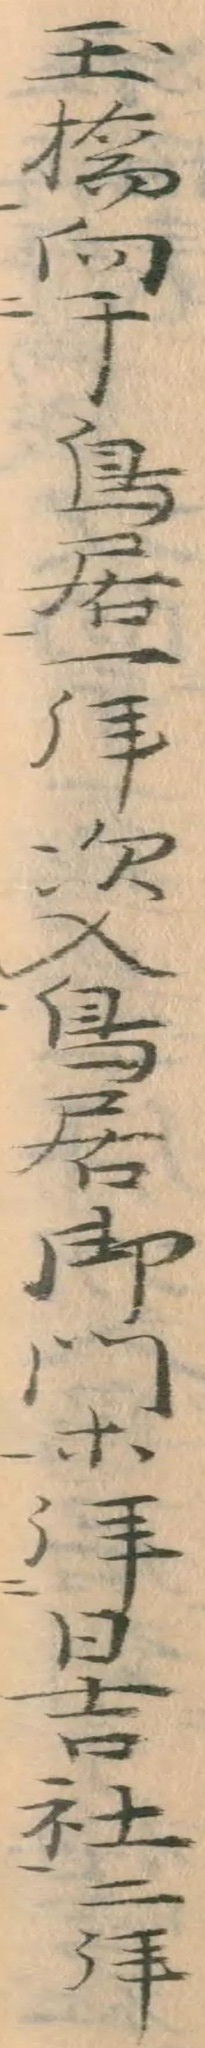玉橋向于鳥居一拝次入鳥居御門等拝日吉社二拝
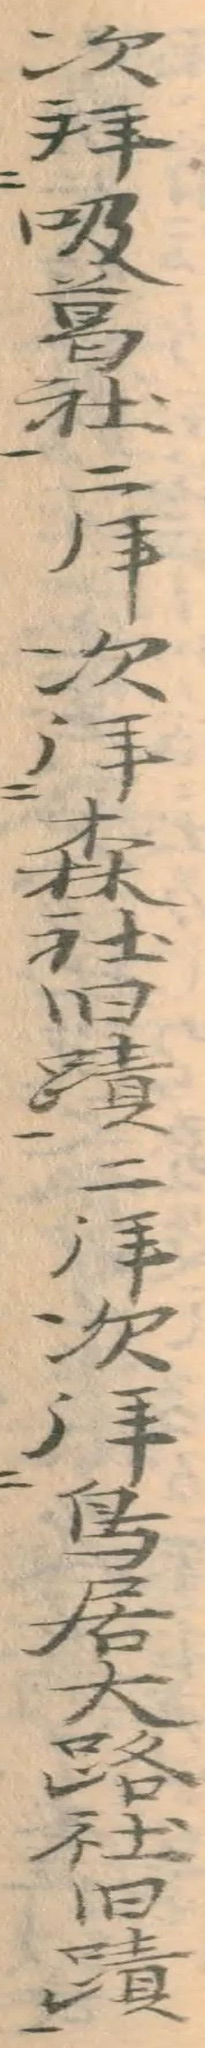次拝吸葛社二拝次拝森社旧蹟二拝次拝鳥居大路社旧蹟
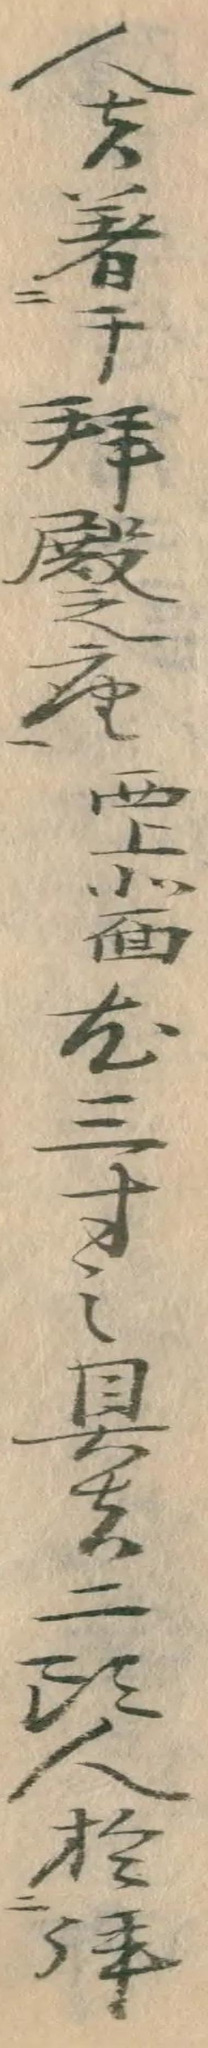人者着于拜殿之座西上北面尤三寸之具者二頭人於拝

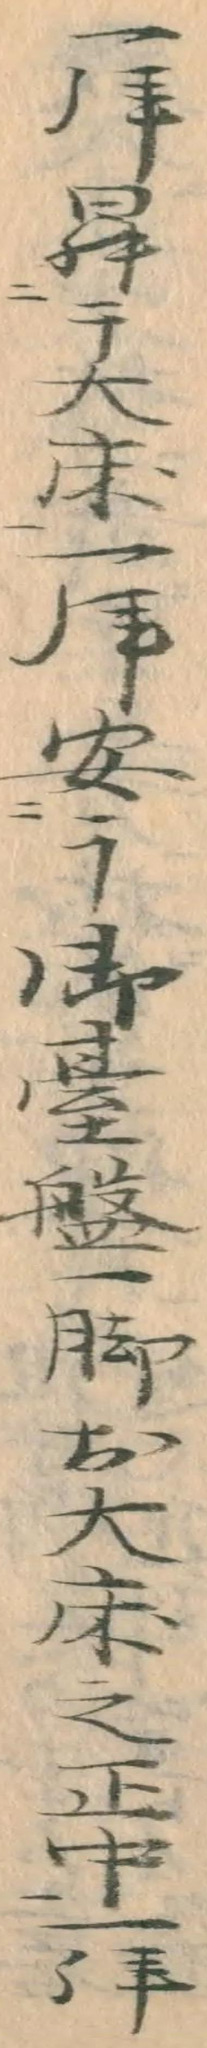一拝昇于大床一拝安于御臺盤一脚於大床之正中一拝
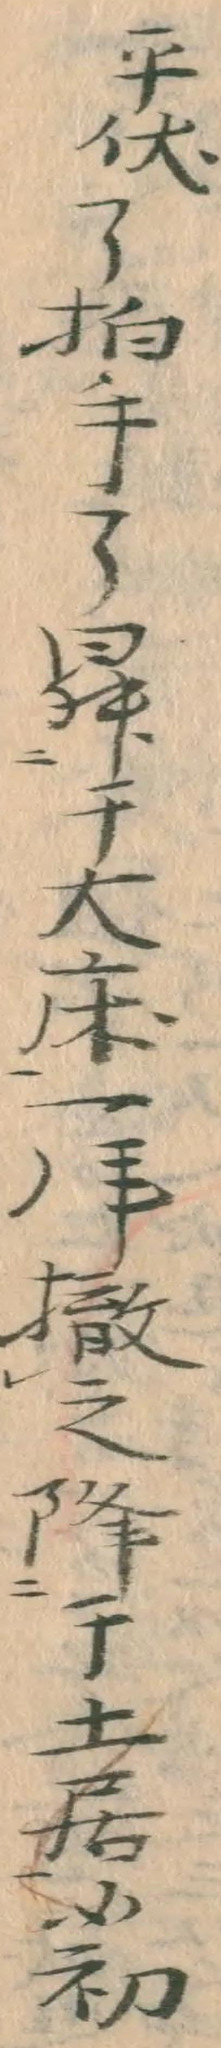平伏了拍手了昇于大床一拝撤之降于土居如初
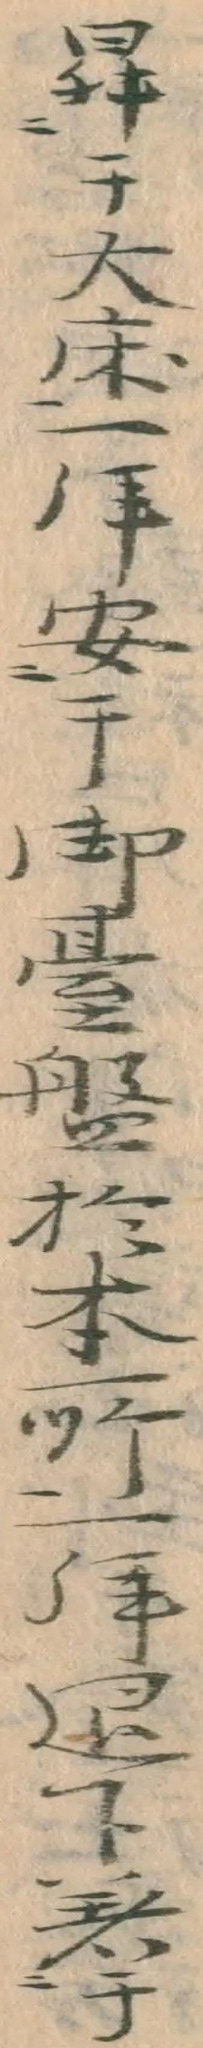昇于大床一拝安于御臺盤於本所一拝退下着于
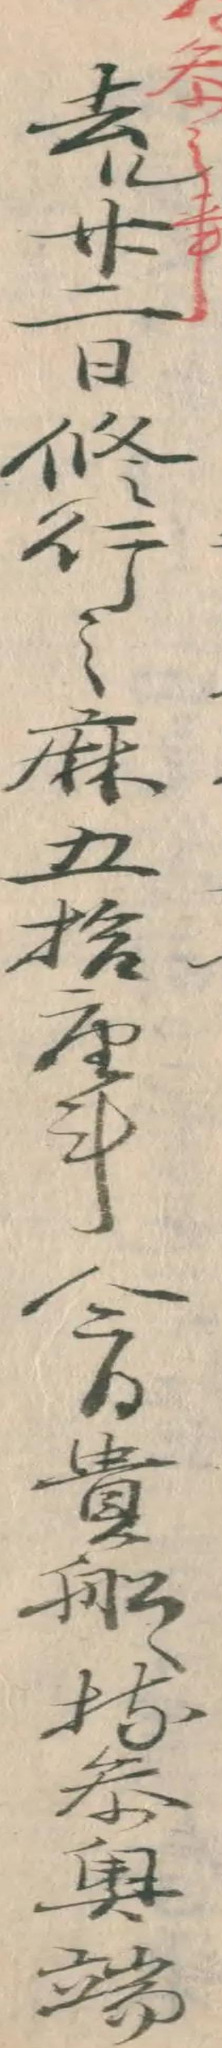一去ル廿二日修行之麻五拾座斗今日貴舩へ持参奥端
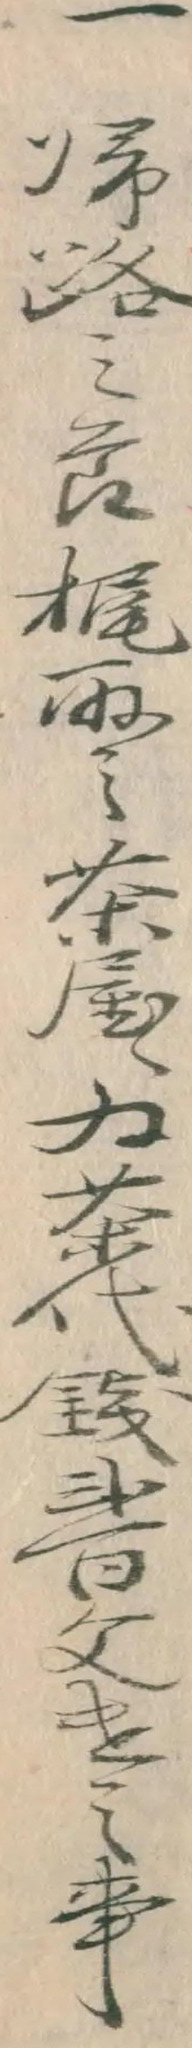一帰路之節梶取之茶屋へ為茶代銭弐百文遣之事

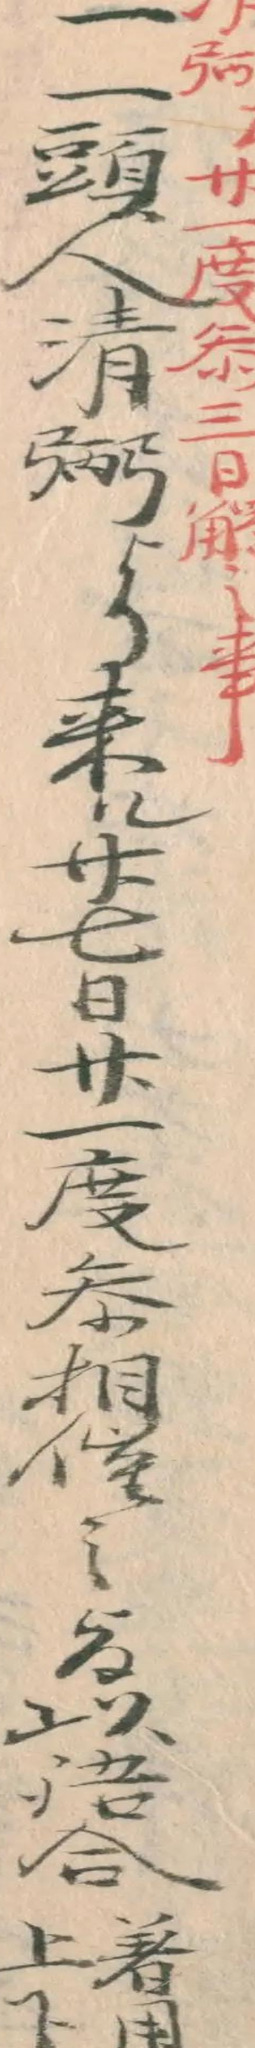一一頭人清弼より来ル廿七日廿一度参相催之旨以語合着用上下
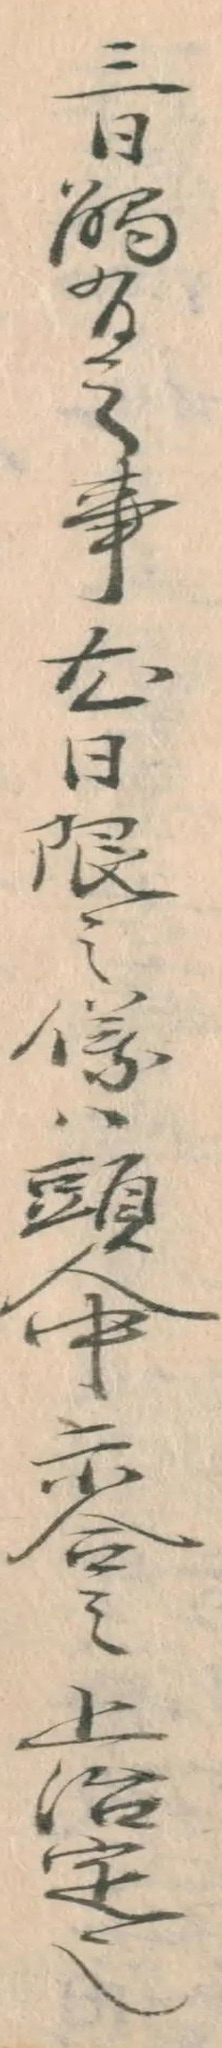三日觸有之事尤日限之儀ハ頭人中示合之上治定也
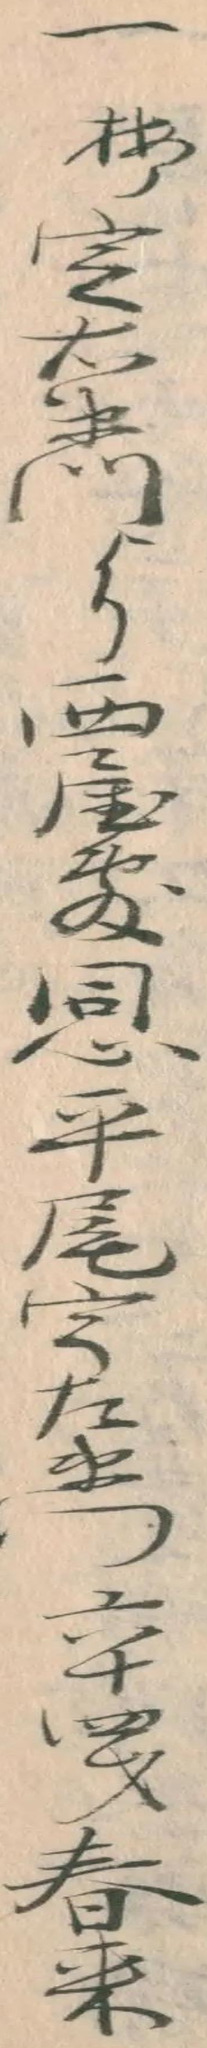一梅定右衛門より西屋敷同心平尾宇左衛門六十四才春来
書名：賀茂社記録. 第72冊
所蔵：国立国会図書館 National Diet Library, JAPAN
